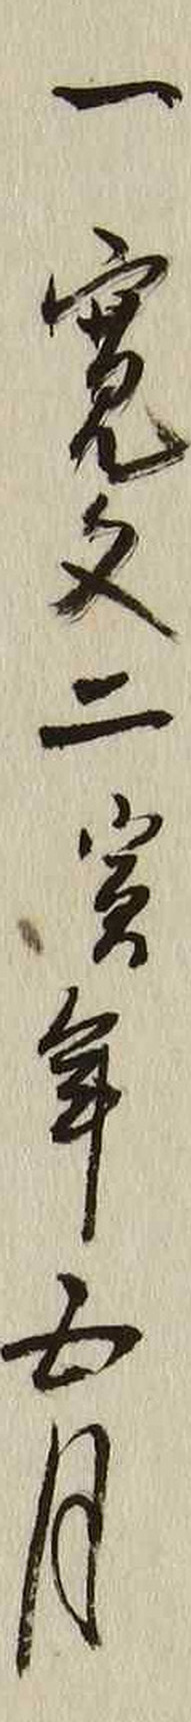一寛文二寅年五月
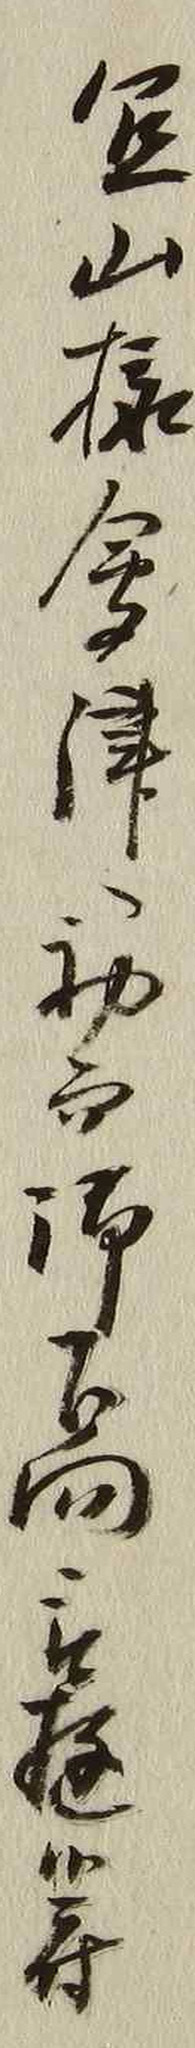宜山様会津へ初而御下向被遊候ニ付
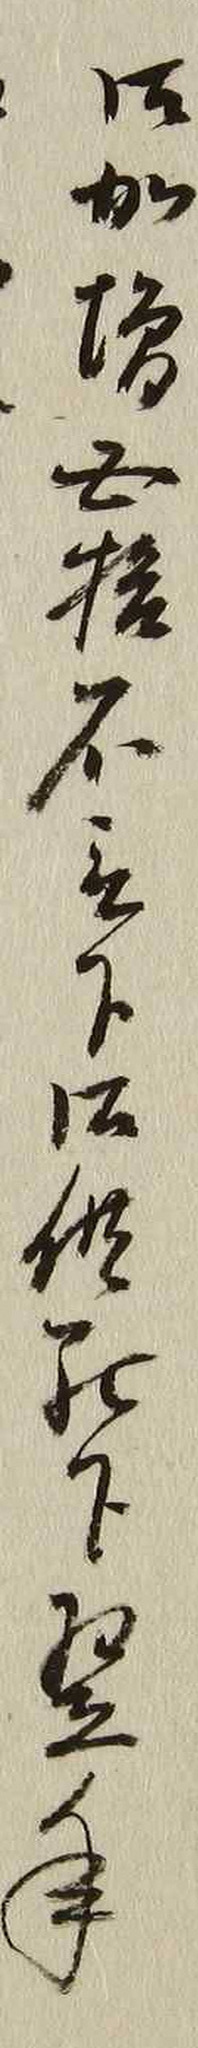御加増五拾石被下御供罷下翌年
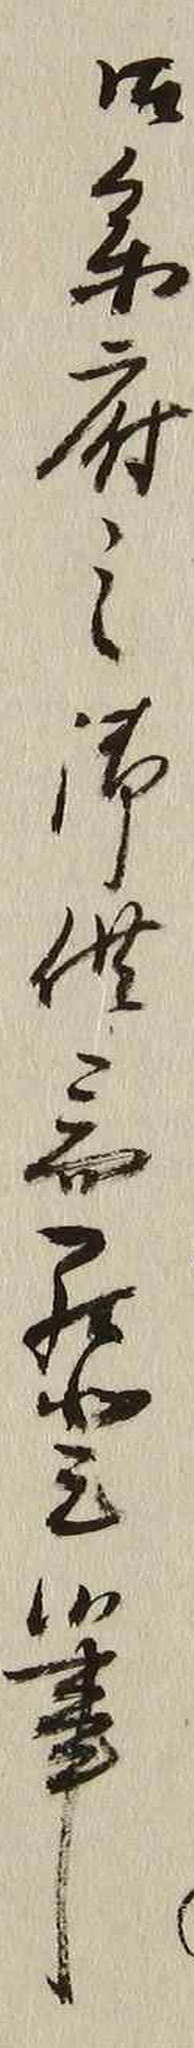御参府之御供ニ而罷登候事
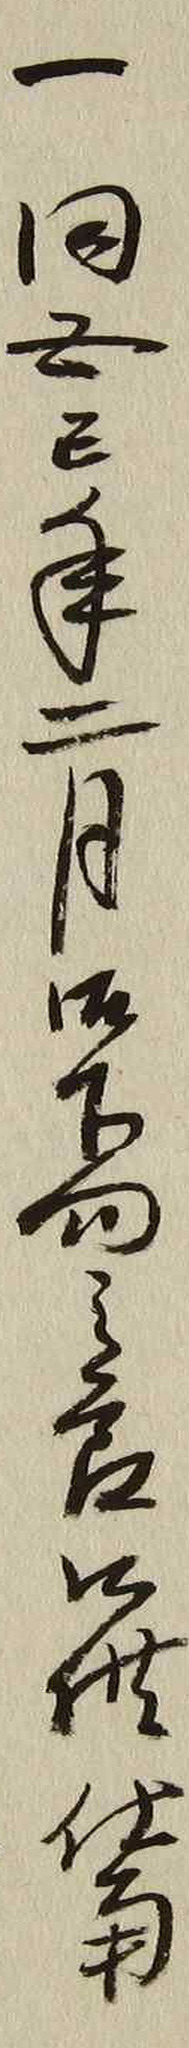一同五巳年二月御下向之節御供仕南
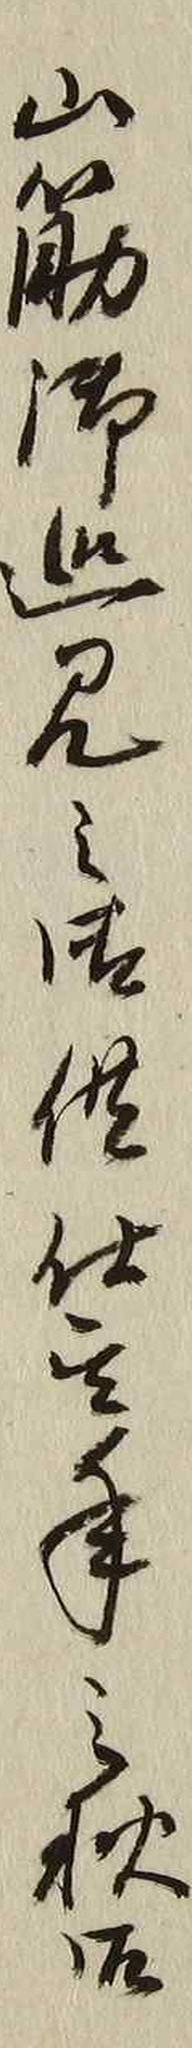山筋御巡見之御供仕其年之秋御
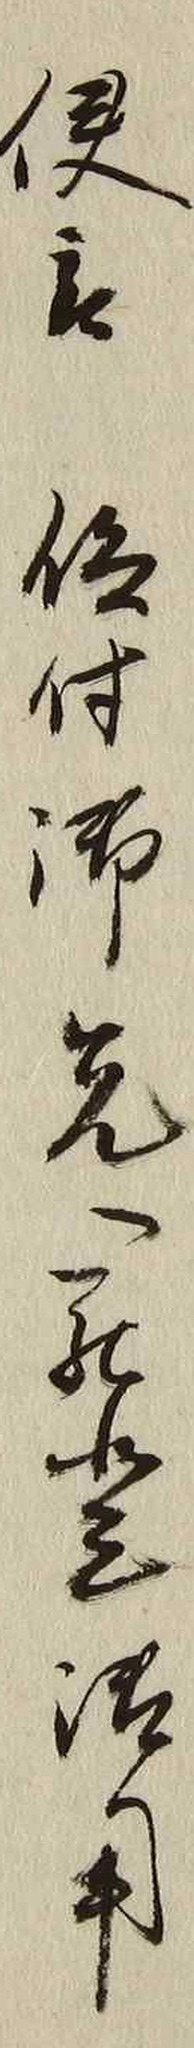使被仰付御先へ罷登御用
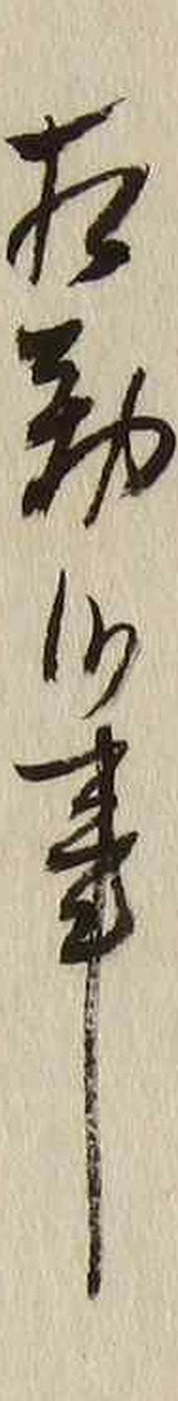相勤候事
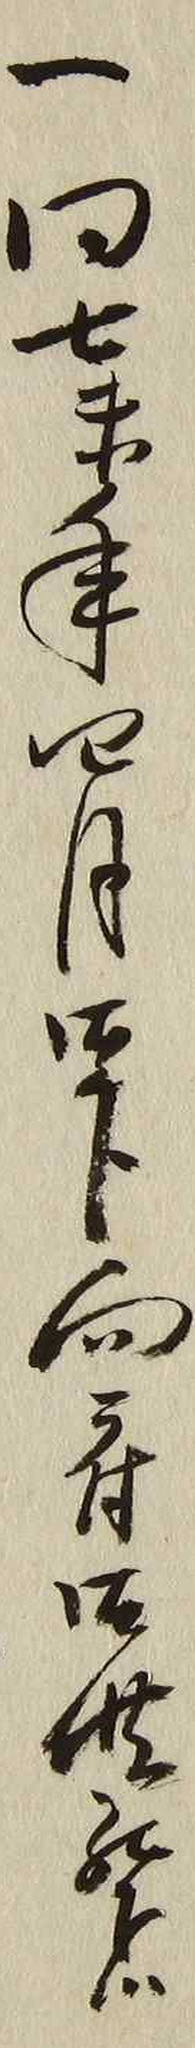一同七未年四月御下向ニ付御供罷下候
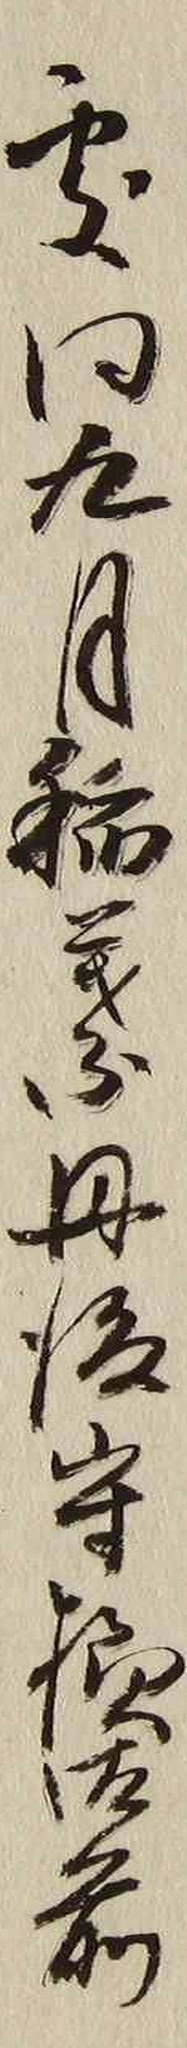処同九月稲葉丹後守様御前
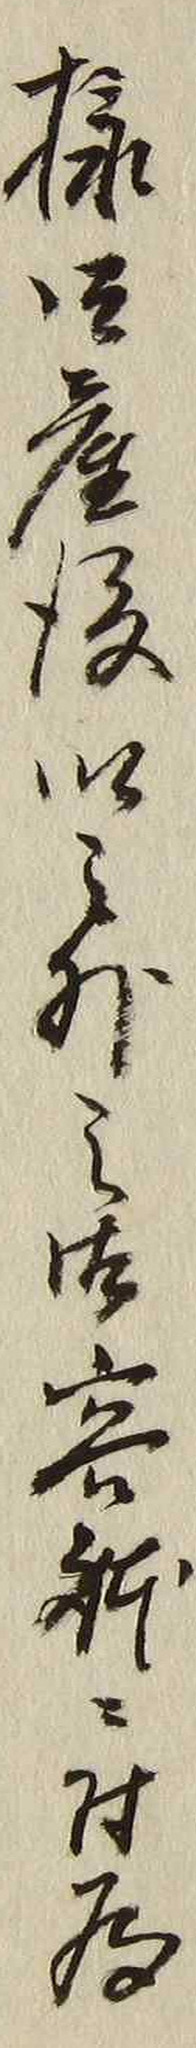様御産後以之外之御客体ニ付為
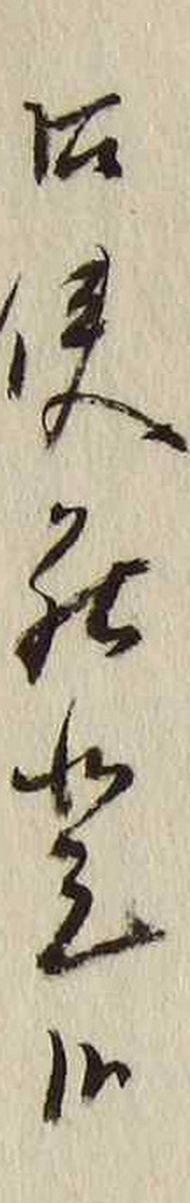御使罷登候
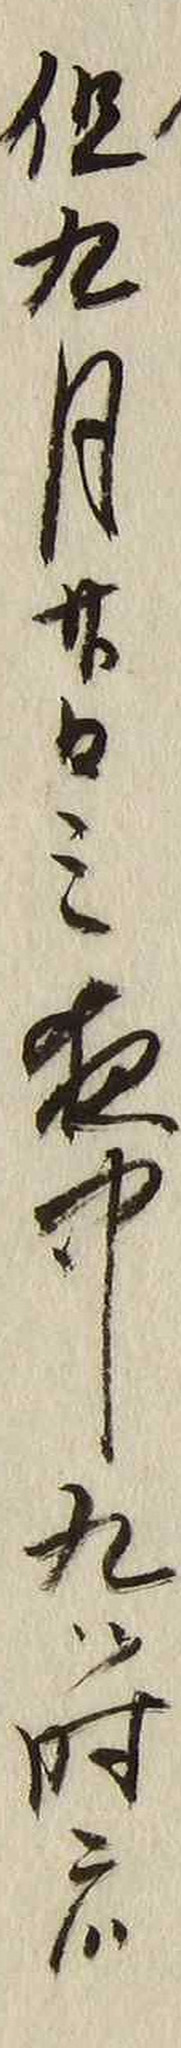但九月廿日之夜中九ツ時ニ候
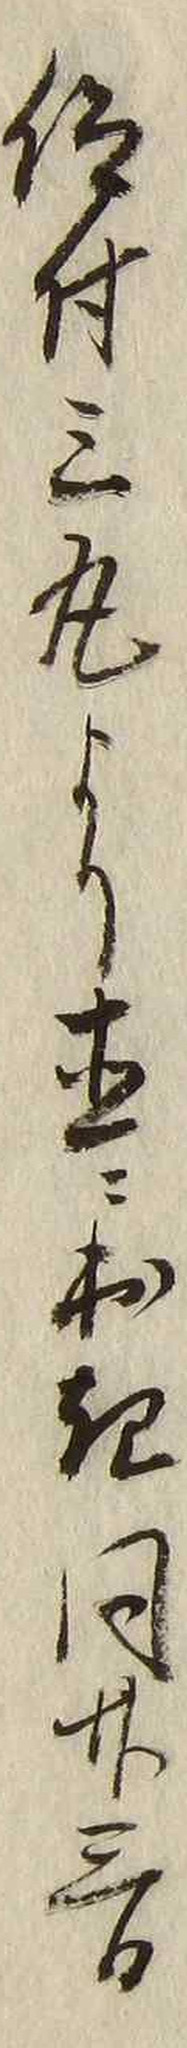仰付三丸より直ニ出起同廿三日

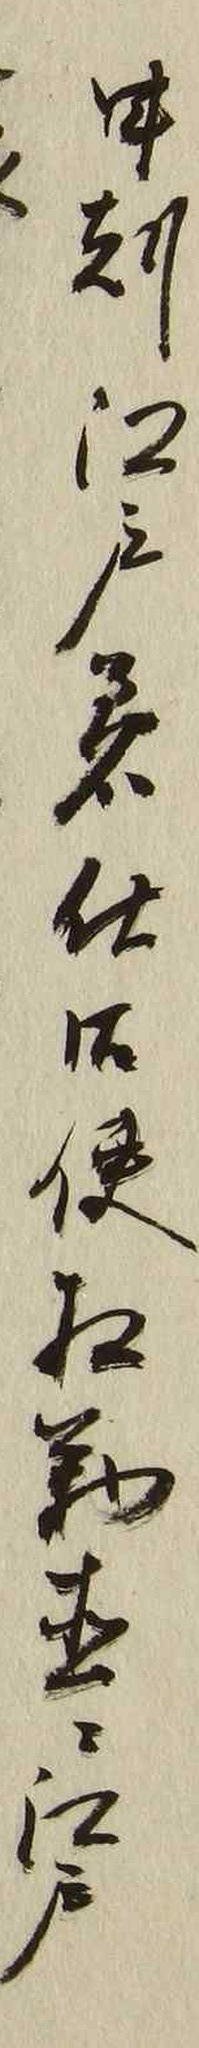申刻江戸着仕御使相勤直ニ江戸
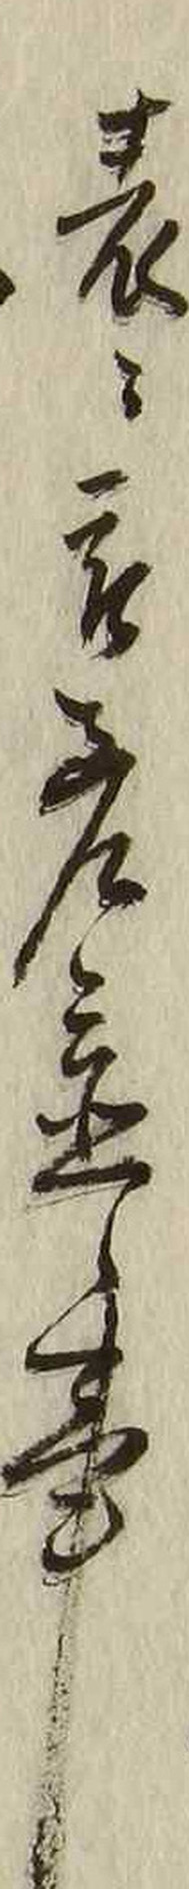表ニ被差置候事
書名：諸士系譜　巻之349　も之部5
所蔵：会津若松市立会津図書館
